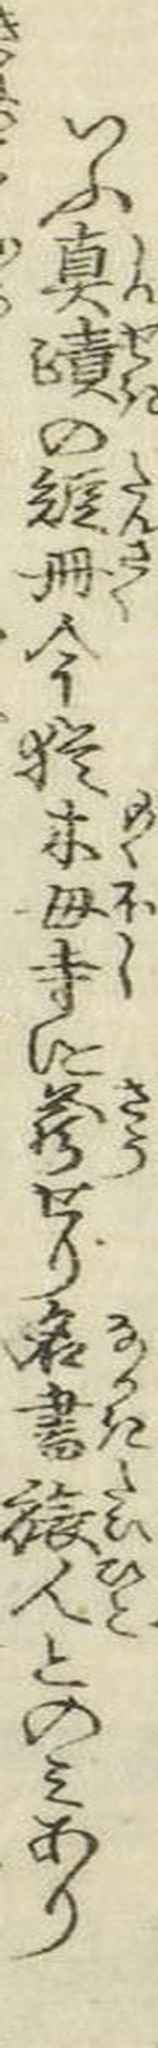いふ真蹟短冊今尚木母寺に蔵せり名書旅人とのみあり
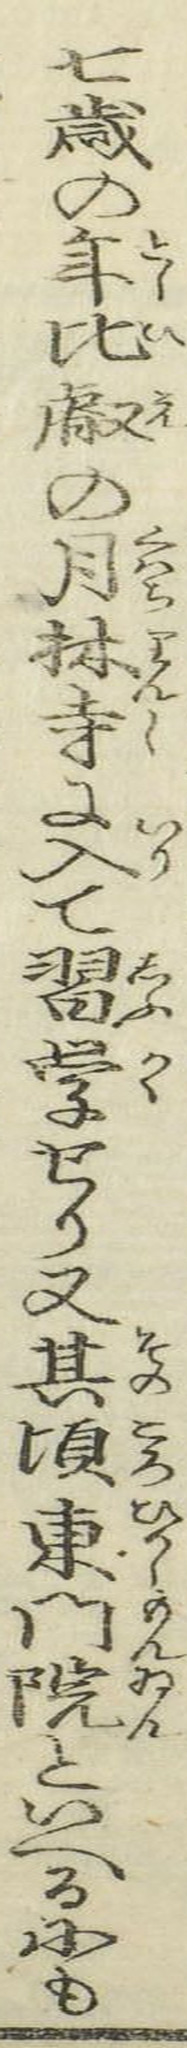七歳の年比叡の月林寺に入て習学せり又其頃東門院といへるにも
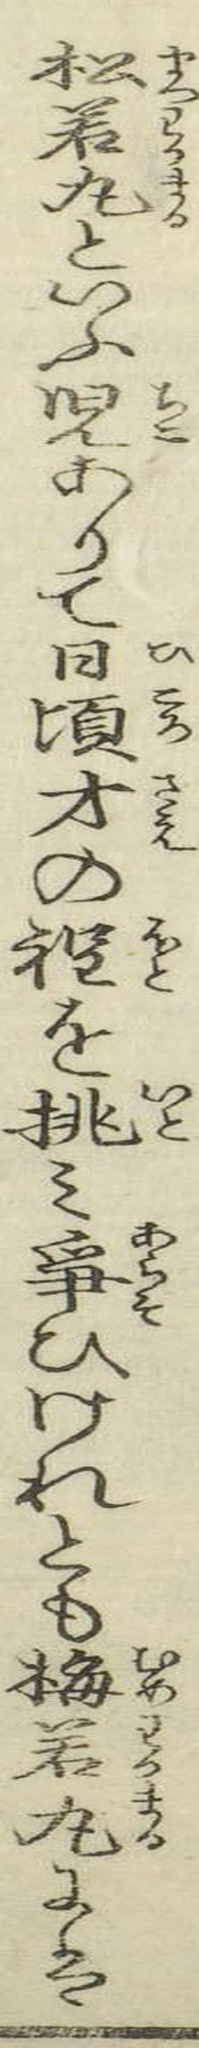松若丸といふ児ありて日頃才の程を挑み争ひけれとも梅若丸には
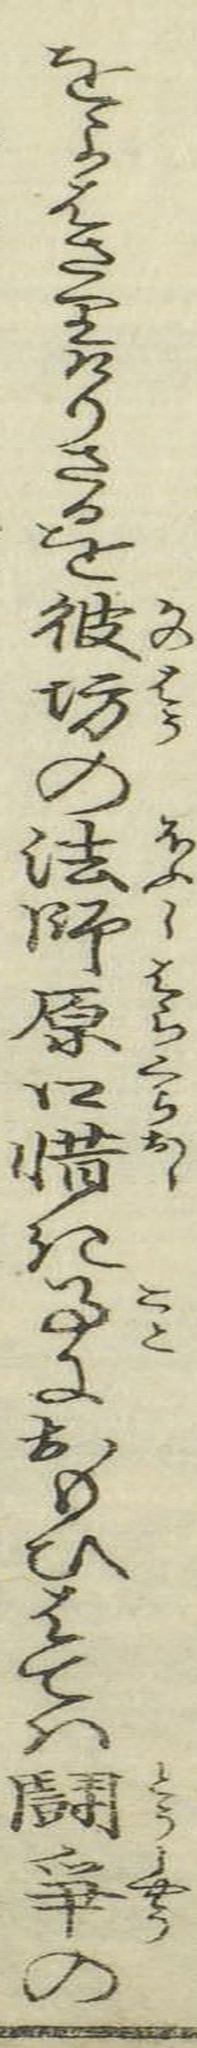をよはさりけりさるを彼坊の法師原口惜き事におもひはては闘争の
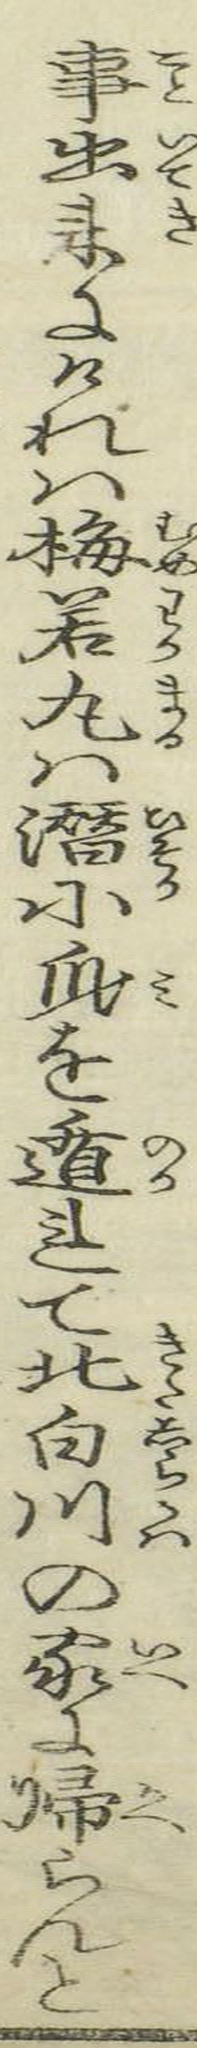事出来にけれは梅若丸は潜に身を遁れて北白川の家に帰らんと
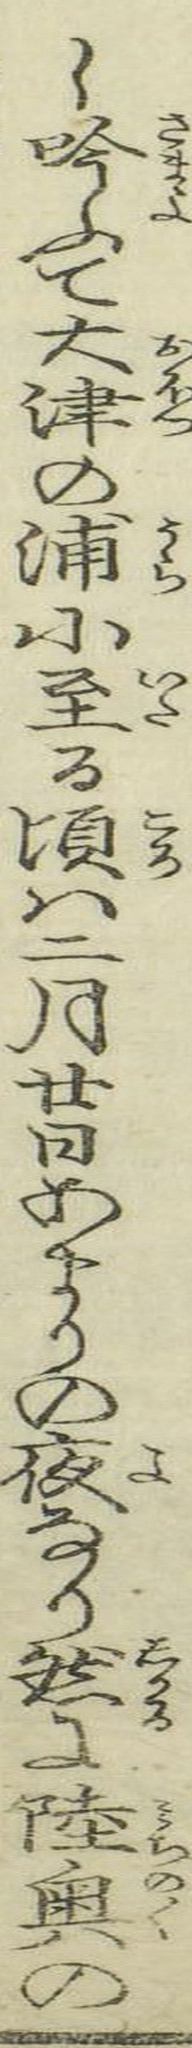し吟ふて大津の浦に至る頃は二月廿日あまりの夜なり然に陸奥の
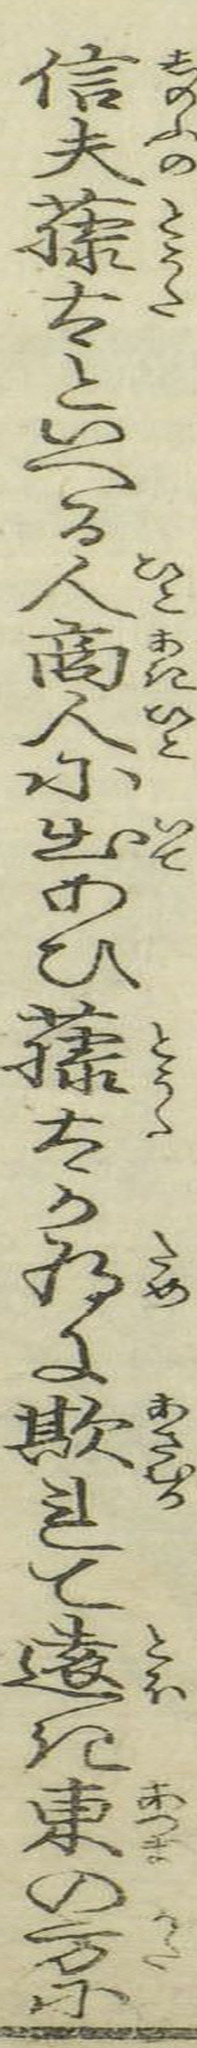信夫藤太といへる人商人に出あひ藤太か為に欺れて遠に東の方に

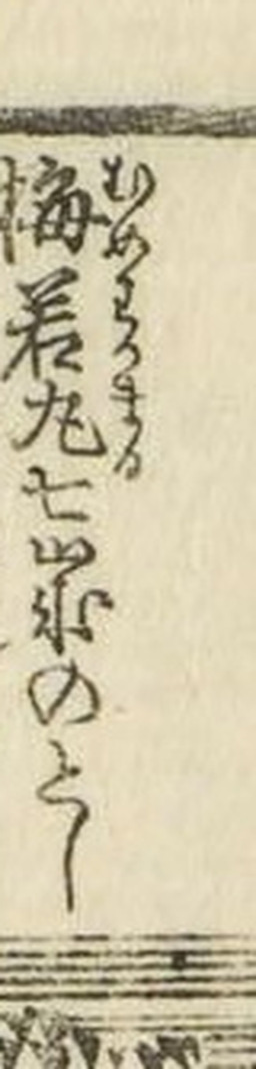梅若丸七歳のとし
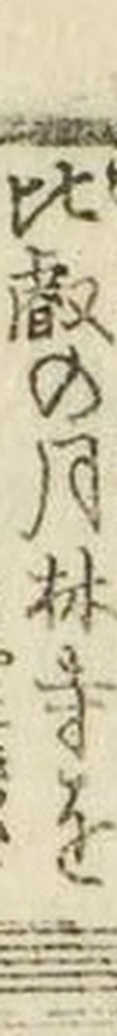比叡の月林寺を
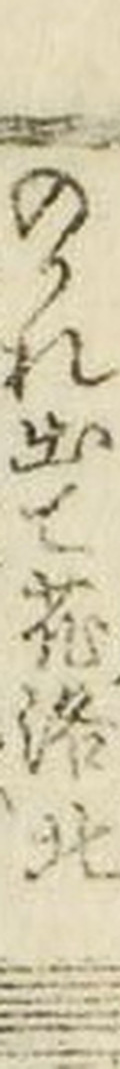のかれ出て花洛北
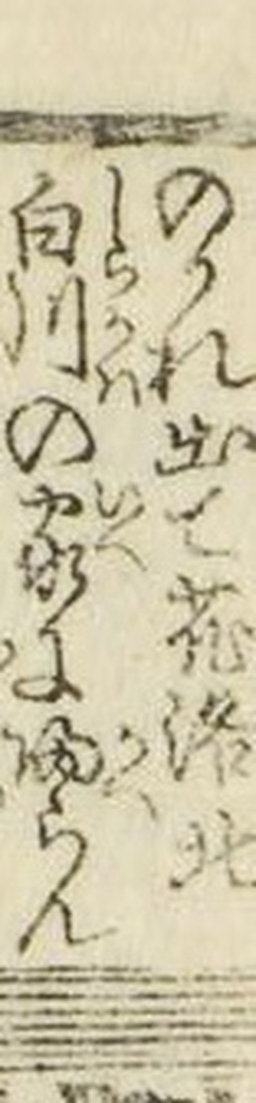白川の家に帰らん
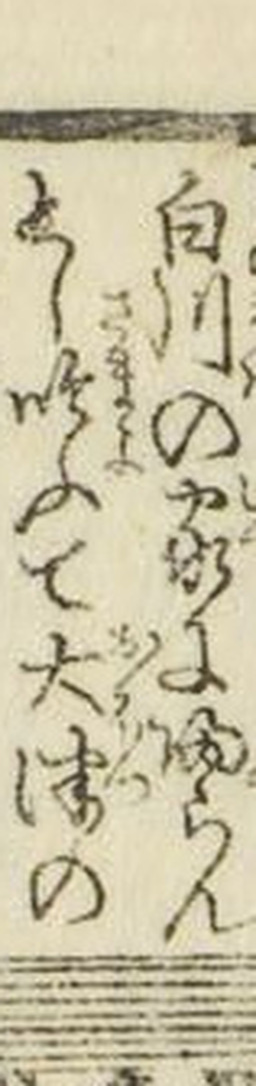とし吟ふて大津の
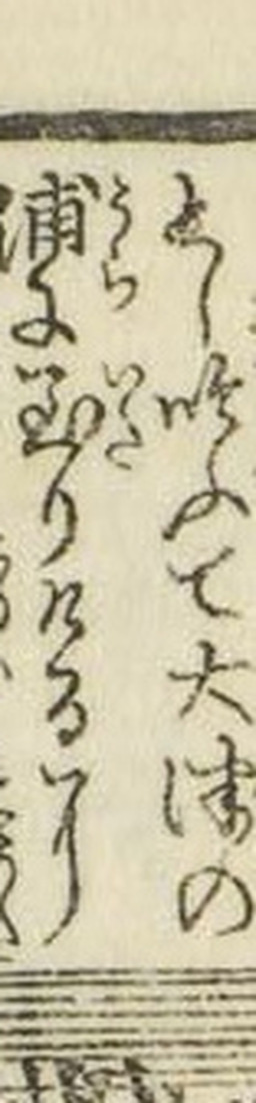浦に至りけるに
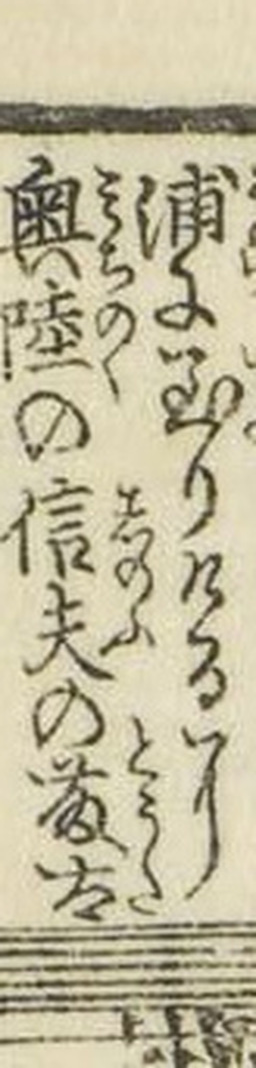陸奥の信夫の藤太
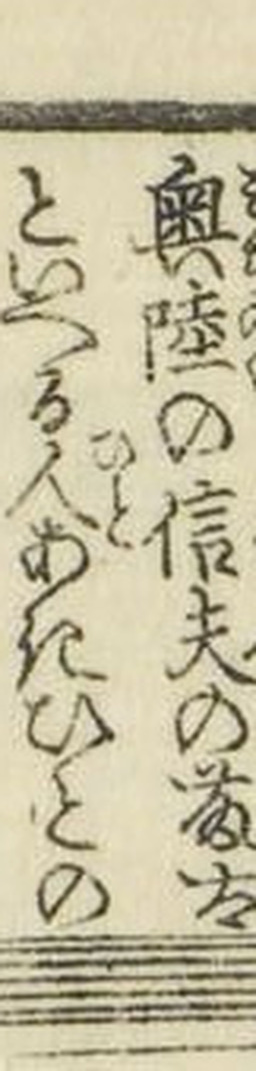といへる人あきひとの
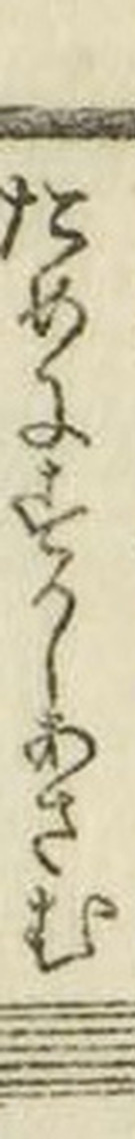ためにすかしあさむ
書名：江戸名所図会 20巻 巻之19
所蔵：東京学芸大学教育コンテンツアーカイブ
